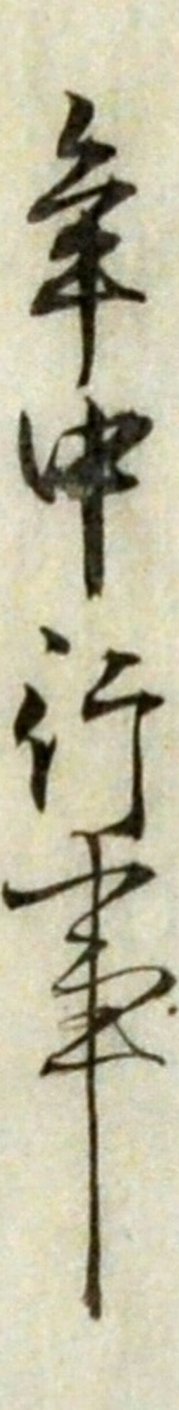年中行事

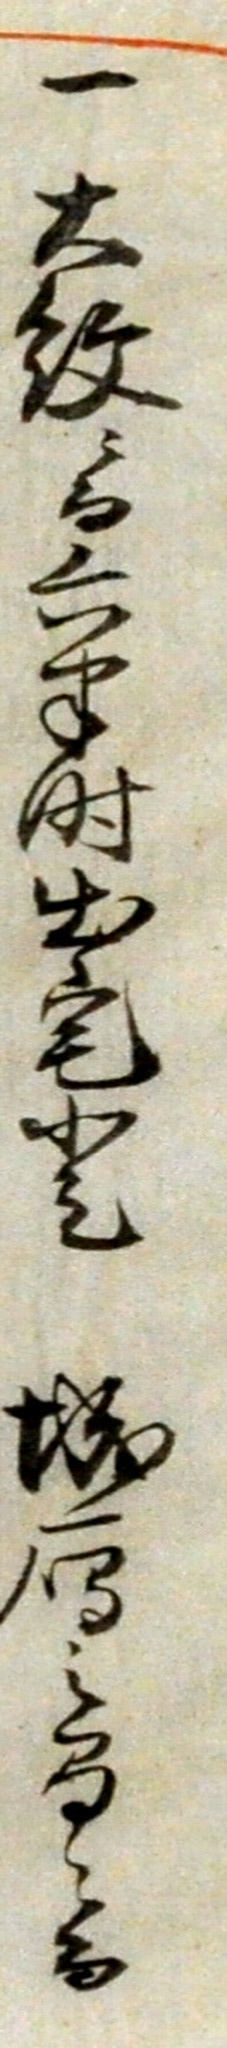一大紋にて六半時出宅登城雁之間にて
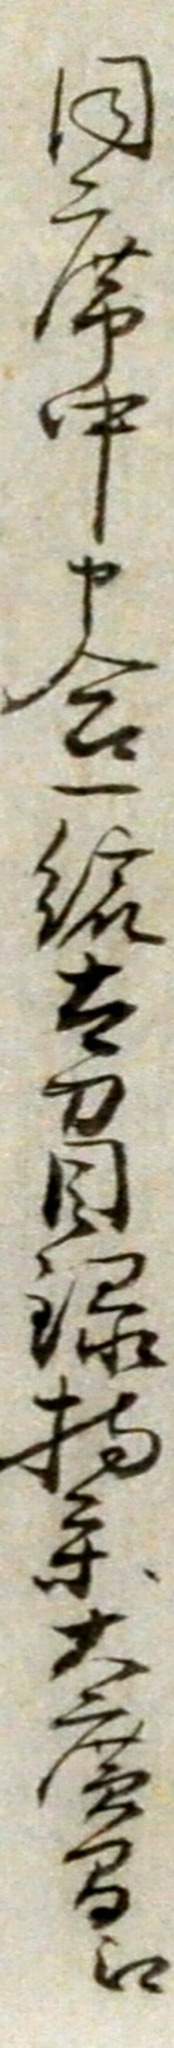同席中申合一統太刀目録持参大広間え
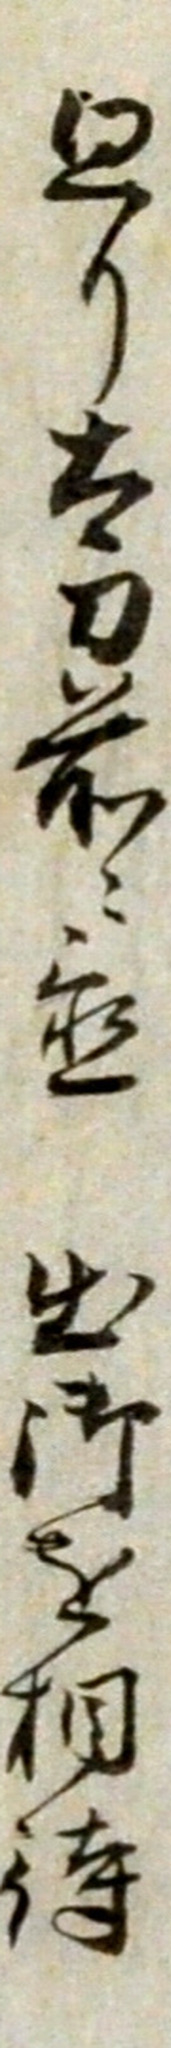廻り太刀前に置出御を相待
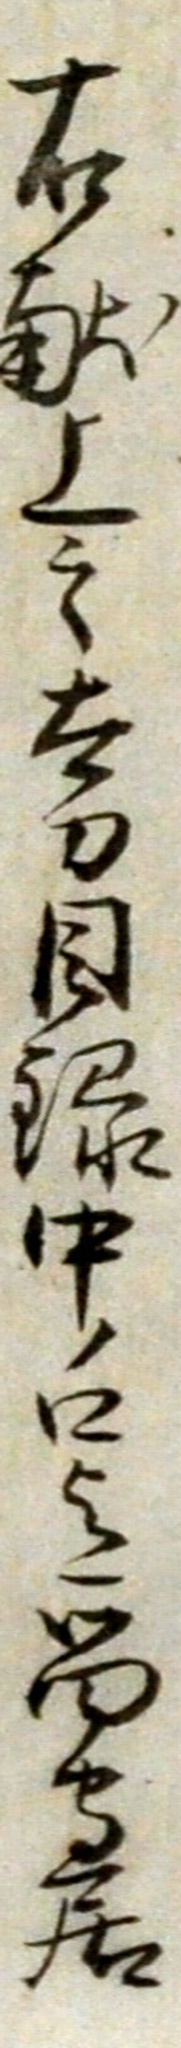右献上之太刀目録中ノ口迄留守居
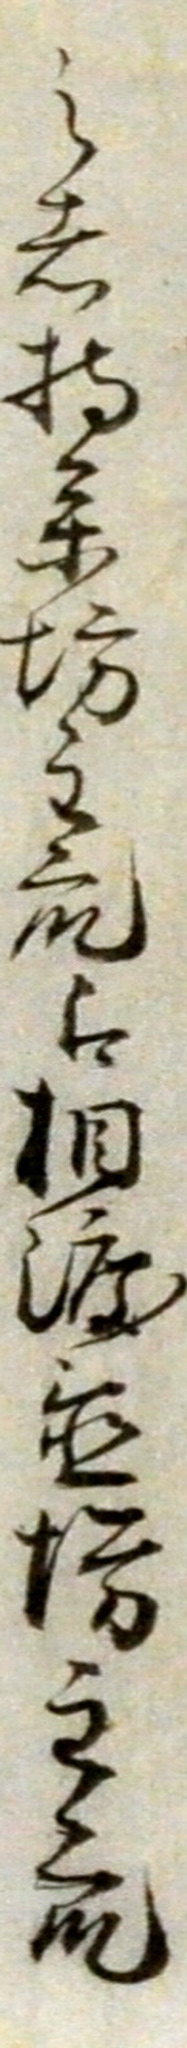之者持参坊主衆え相渡置坊主衆
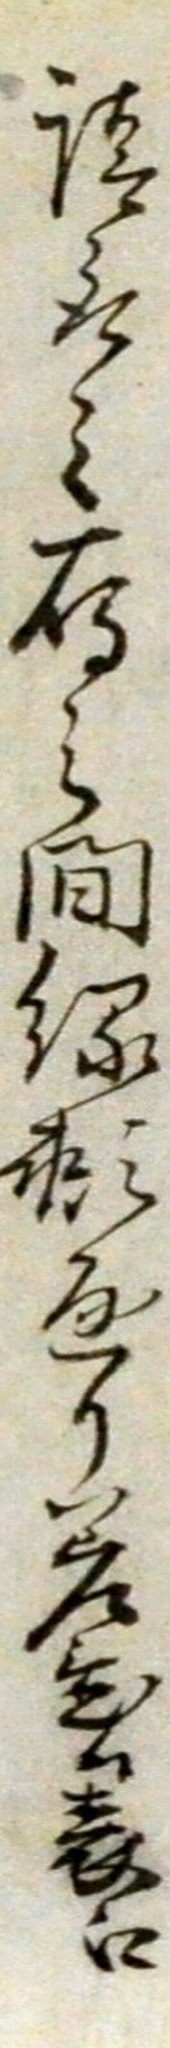請取之雁之間縁頬通り差置候表え
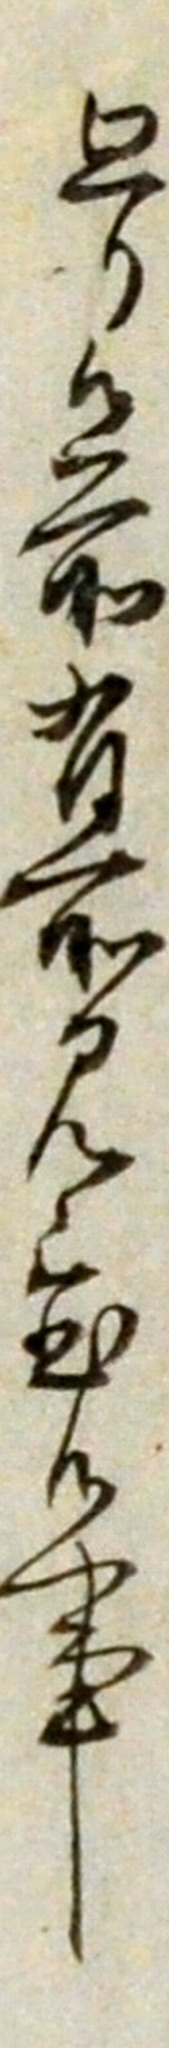廻り候前有所見置候事
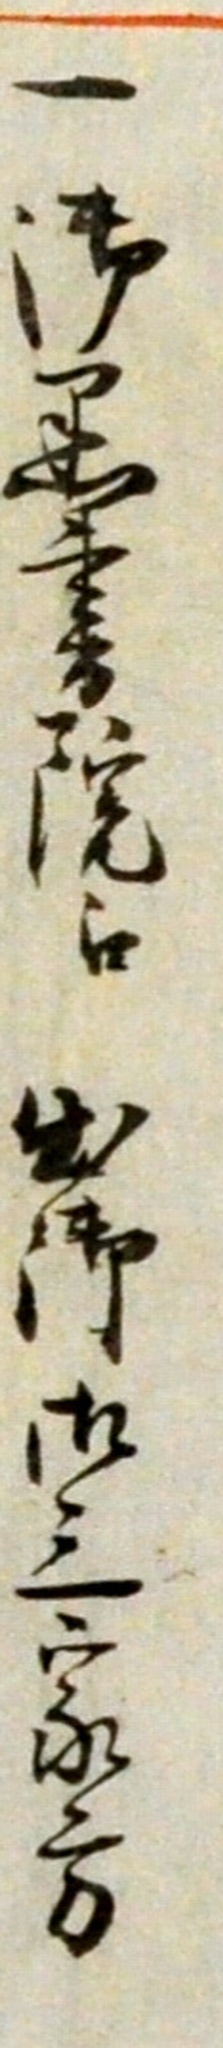一御黒書院え出御御三家方
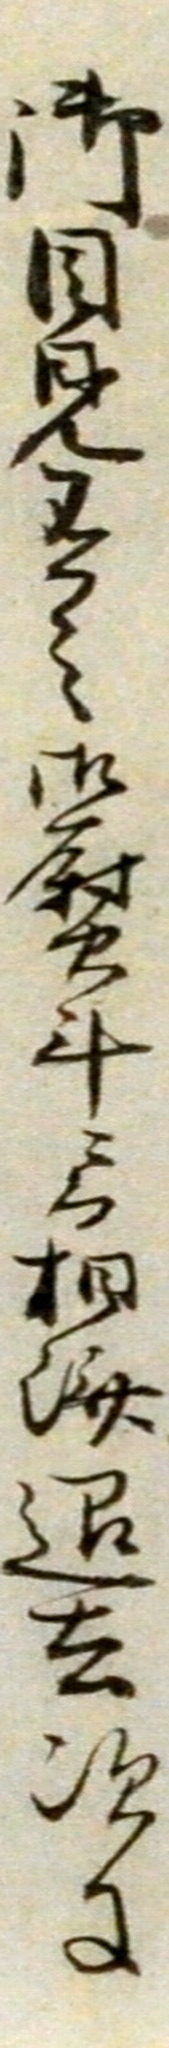御目見有之御熨斗にて相済退去次に
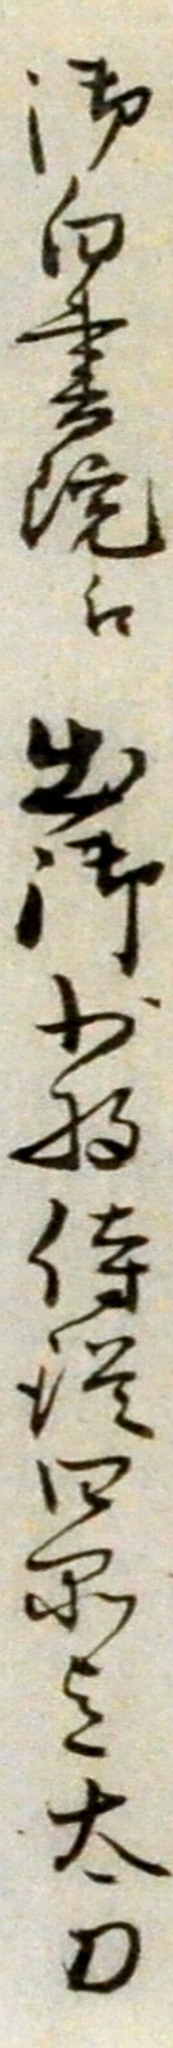御白書院え出御少将侍従四品迄太刀
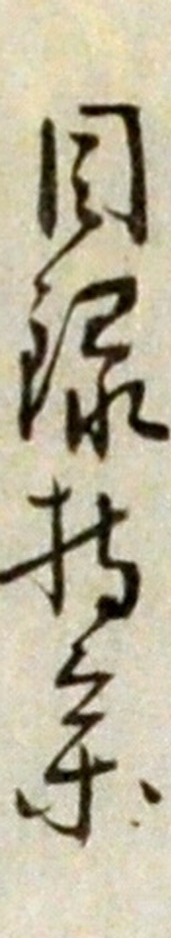目録持参
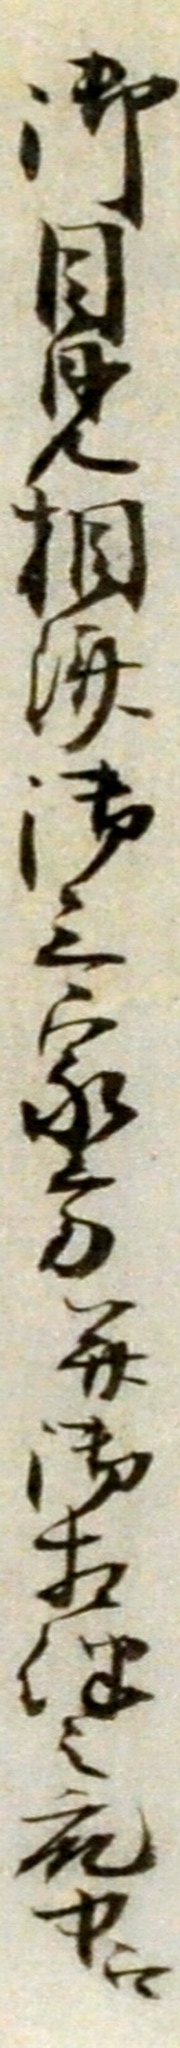御目付相済御三家方并御相伴之衆中え
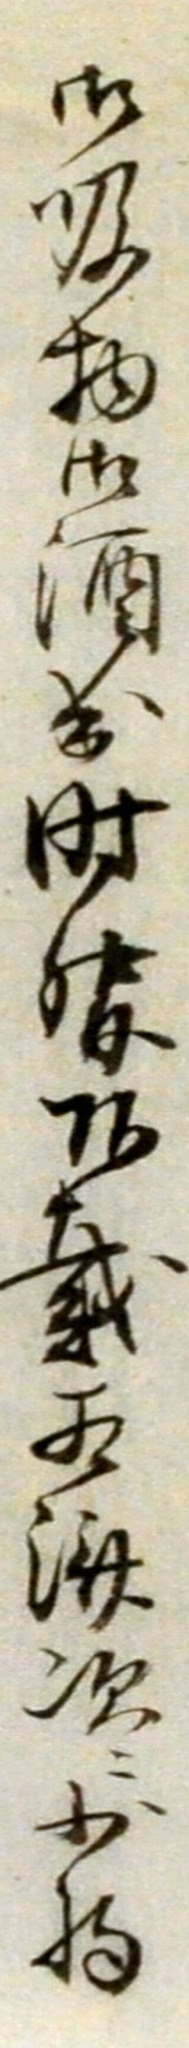御吸物御酒出時服頂戴相済次に少将
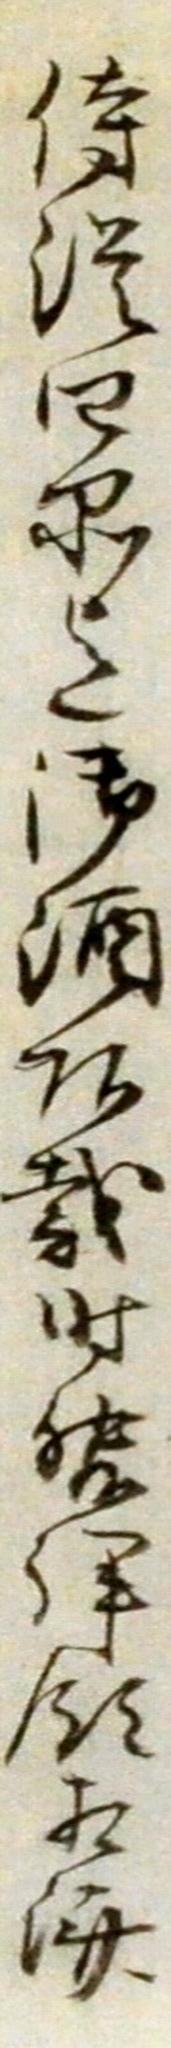侍従四品迄御酒頂戴時服拝領相済
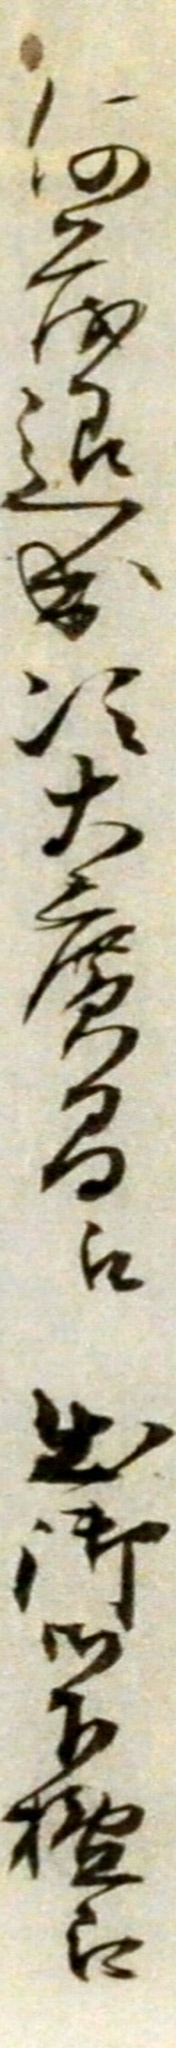何も退出次大広間え出御御下壇え
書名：申合帳〔一括〕
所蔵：伊那市立高遠町図書館・合同会社AMANE
